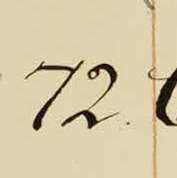72.
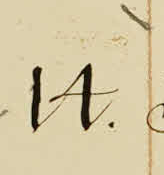14.
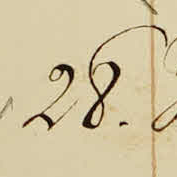28.
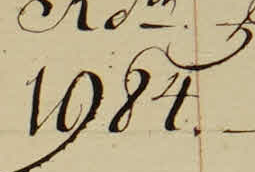1984.
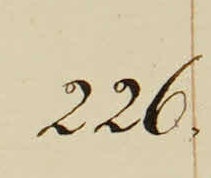226
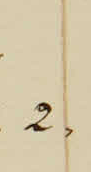2
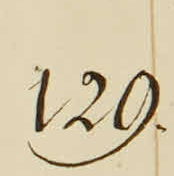129.
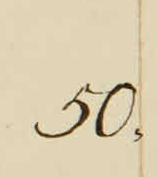50
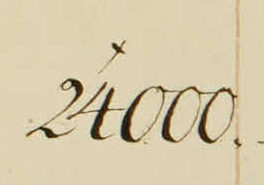24000
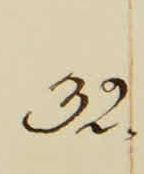32
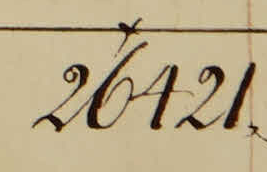26421
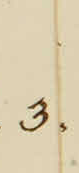3
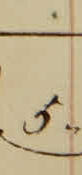5
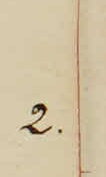2.
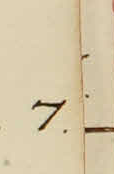7.
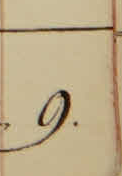9.
